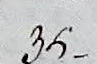35
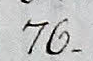76
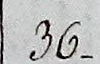36
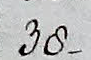38
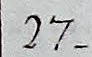27
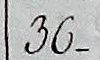36
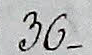36
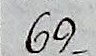69
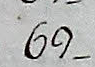69
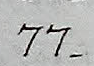77
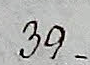39
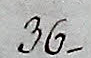36
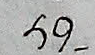59
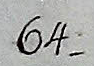64
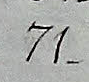71
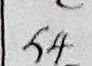54
